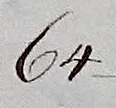64
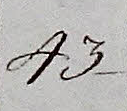43
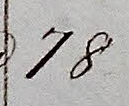78
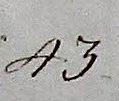43
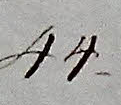44
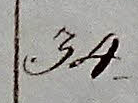34
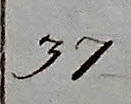37
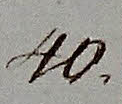40
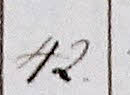42.
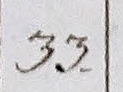33.
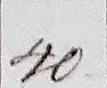40
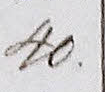40
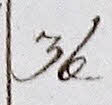36
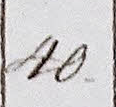40
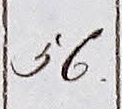56
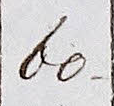60
